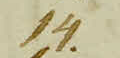14.
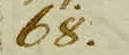68.
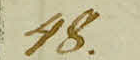48.
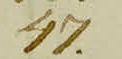47.
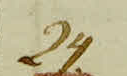24.
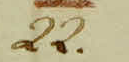22.
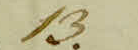13.
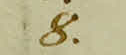8.
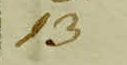13
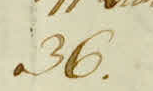36.
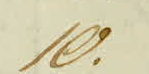10.
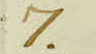7.
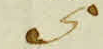5
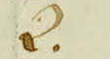2.
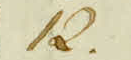12.
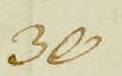30
